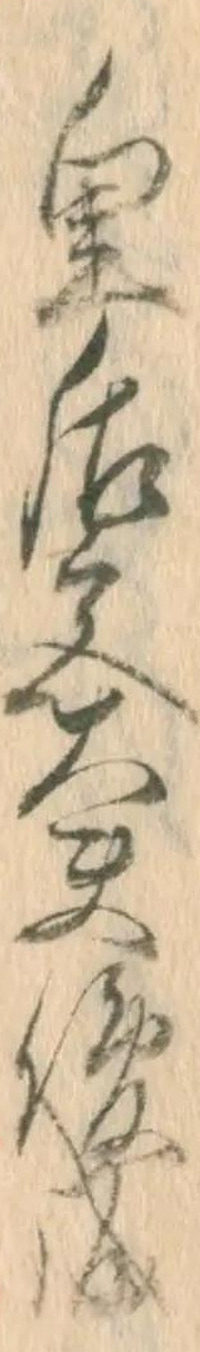皇后宮大夫俊成
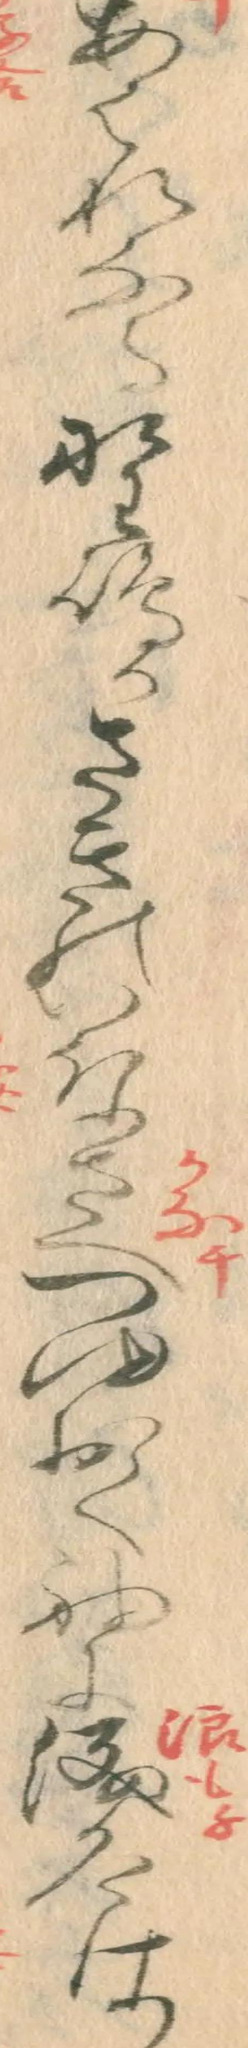あはれなる野島かさきのいほりさへつゆおく袖に涙かけけり
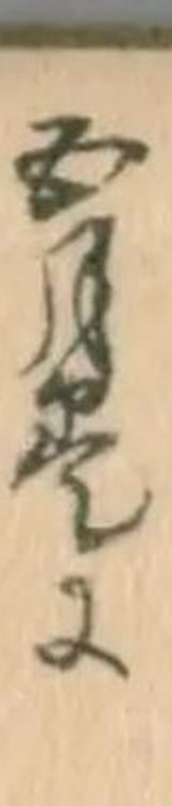五月巻に
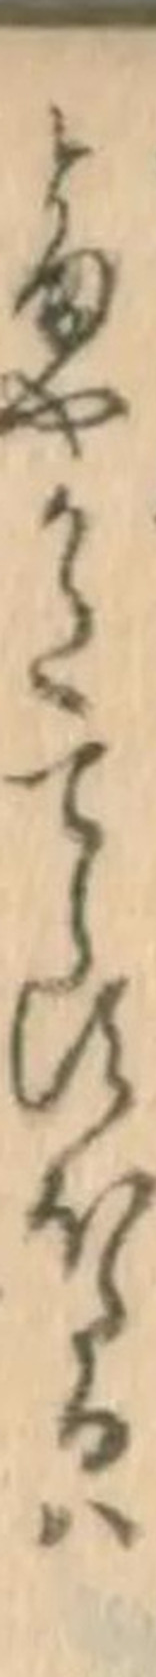とまやかたてらすほたるは
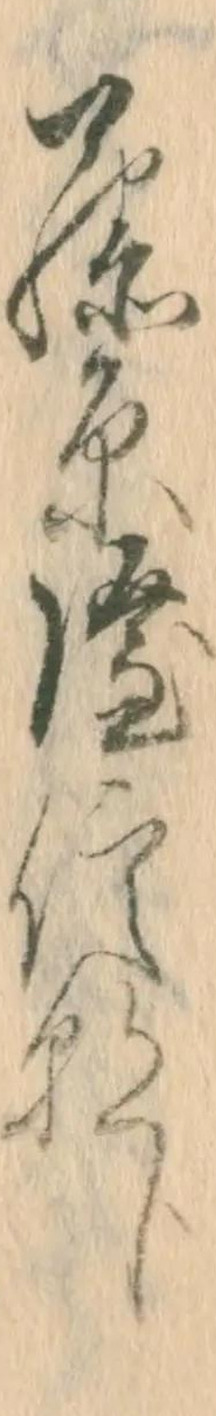藤原澄行朝臣
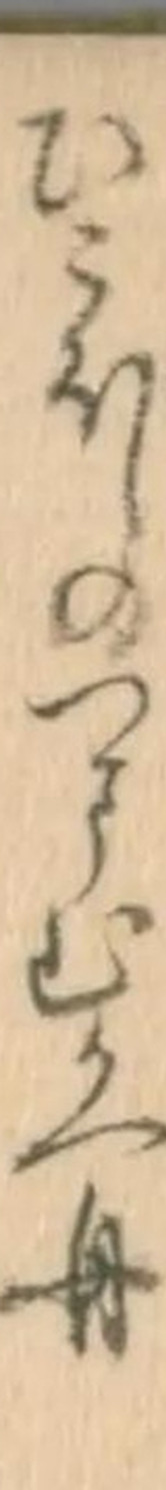ひこほしのつまむかへ舟
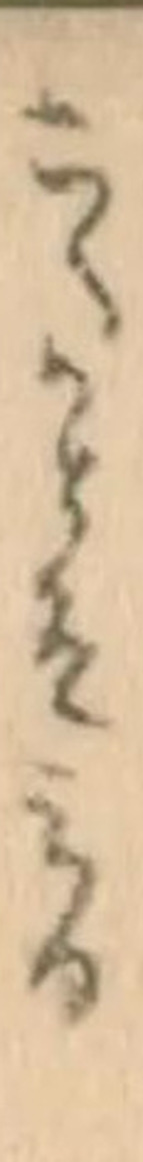こくかとそみる
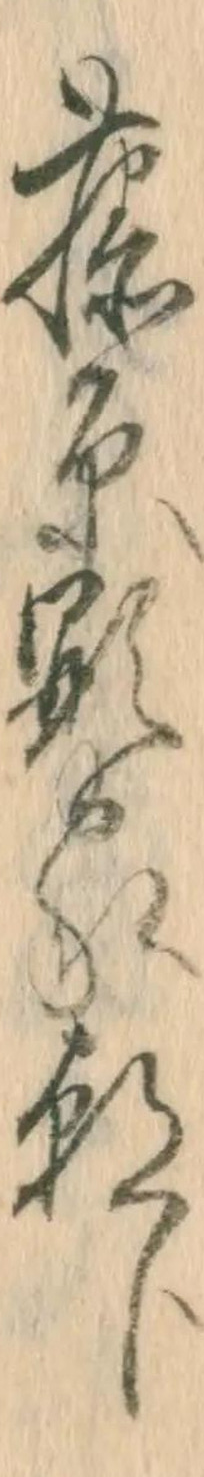藤原顕家朝臣
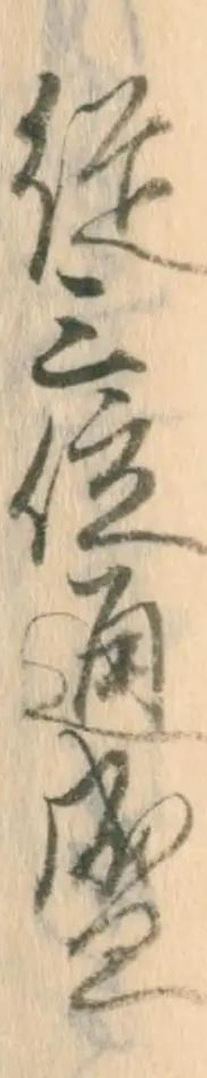従三位通盛
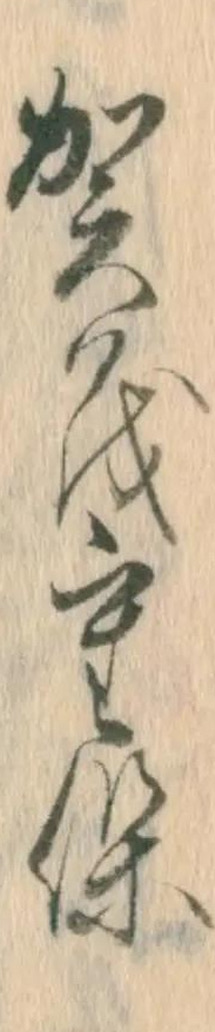賀茂重保
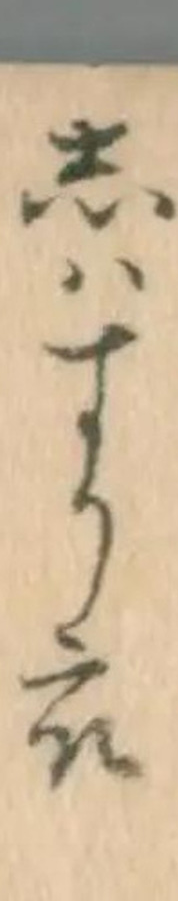しはすり衣
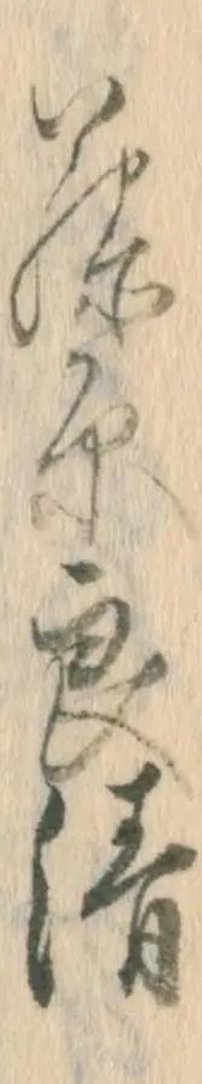藤原良清
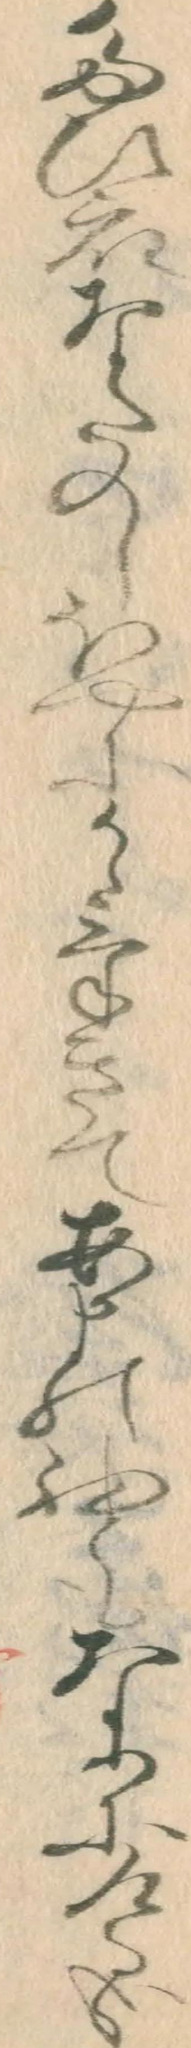たひ衣なたのしほやにかゝけきてあまの袖ともなりにける哉
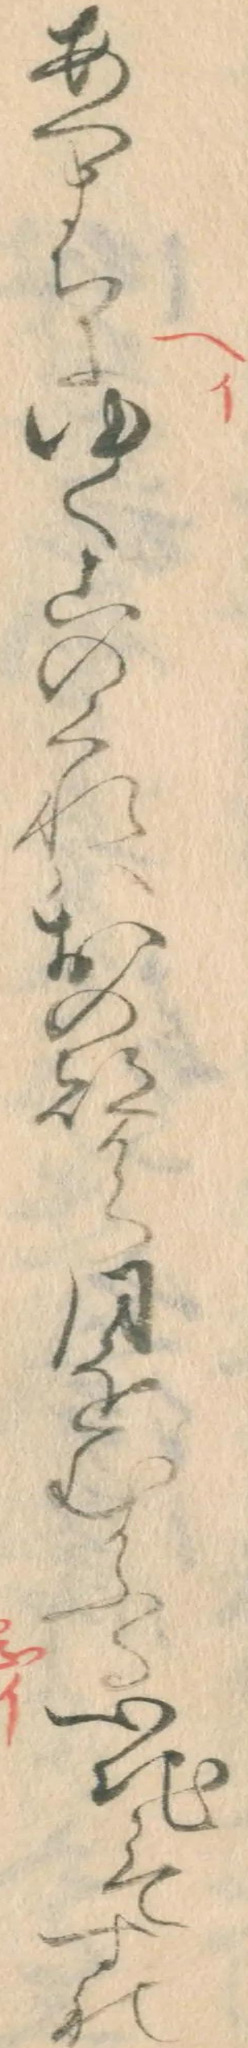あつまちにゆくこのくれはおのつから月をむかふる心地こそすれ
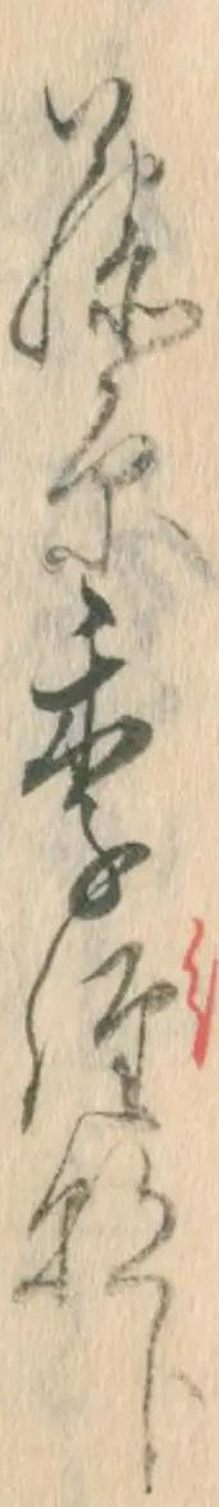藤原季経朝臣
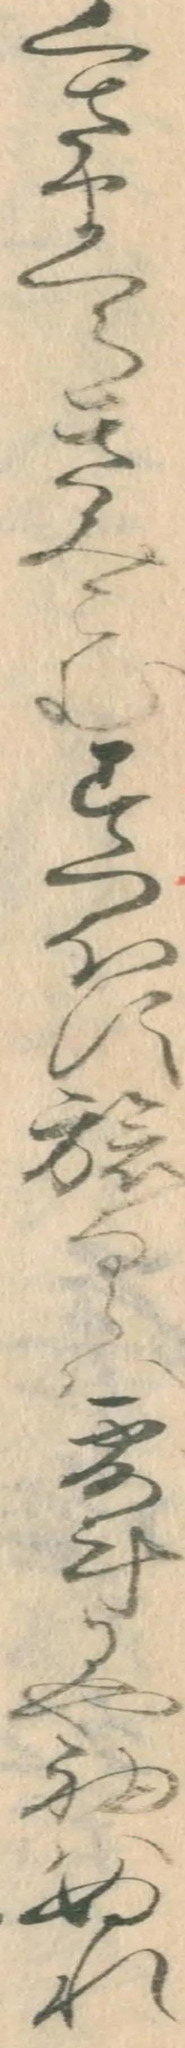くさまくらきみとむすへほす旅ならは露斗にや袖はぬれまし
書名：月詣和歌集
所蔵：国立国会図書館 National Diet Library, JAPAN
